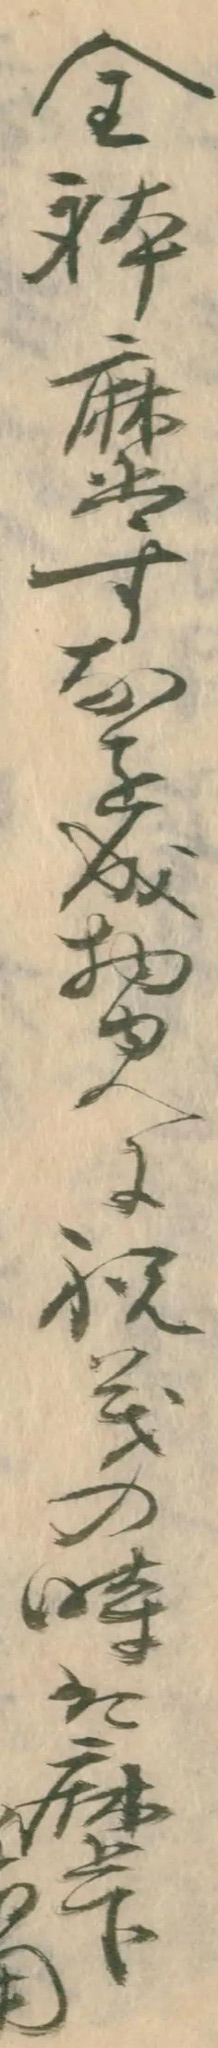全体麻はすなを成物ゆへに祝義の時は麻上下
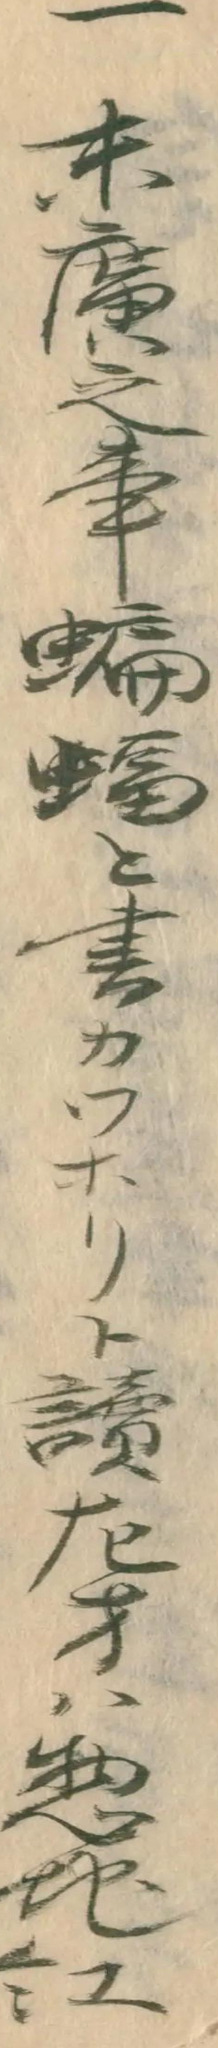一末広之事蝙蝠と書カワホリと読左方は惣地紅
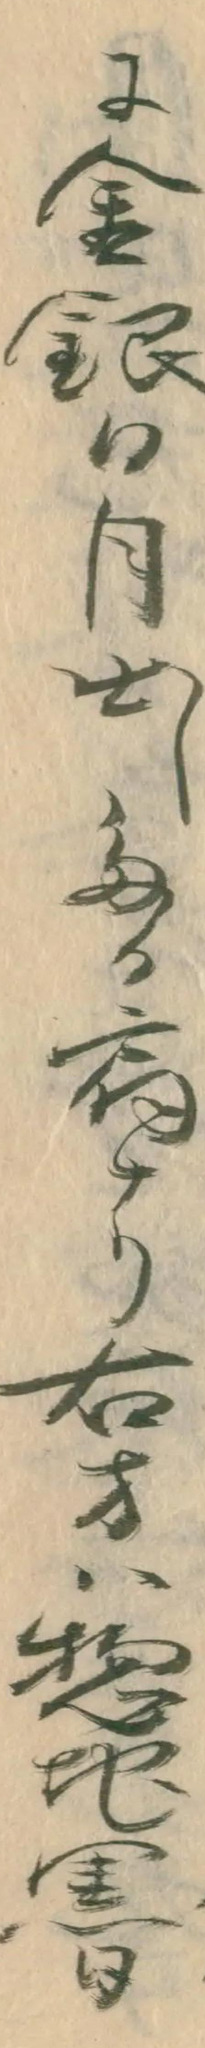に金銀日月出したる扇なり右方は惣地黒日

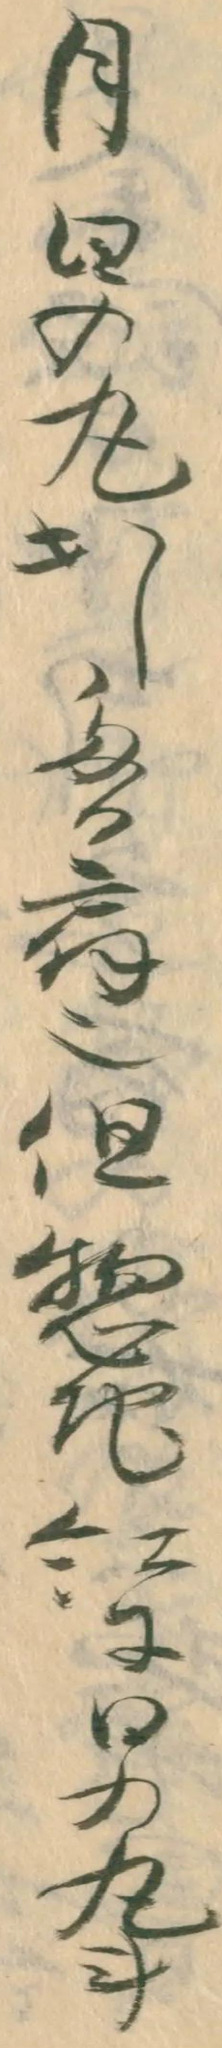月日の丸出したる扇也但惣地紅に日の丸斗
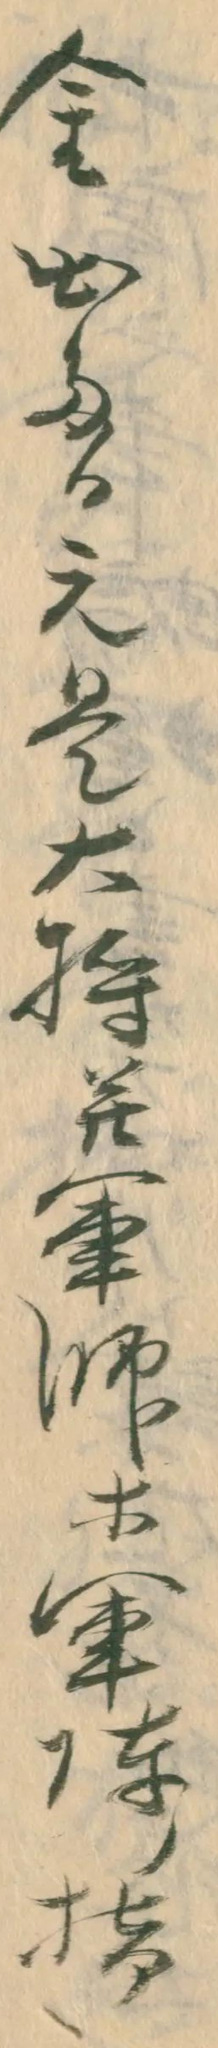金出たる元是大将并軍師等軍陣の指
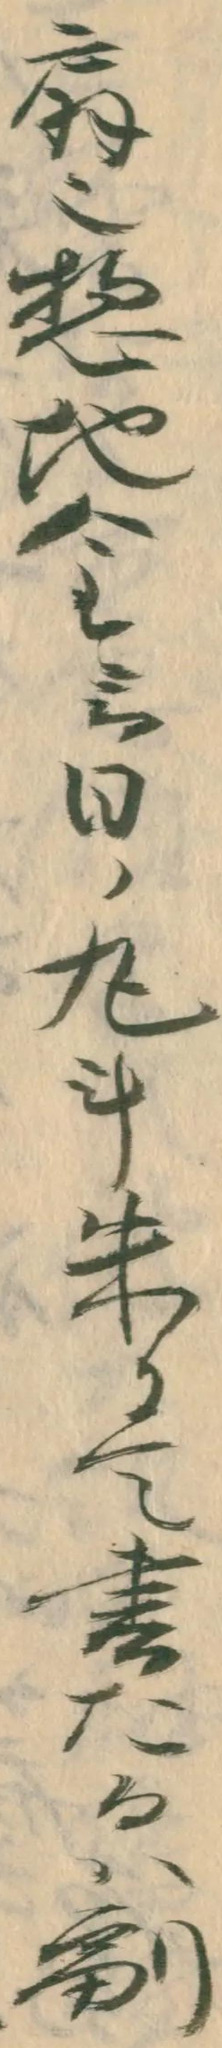扇也惣地金に而日の丸斗朱にて書たるは副
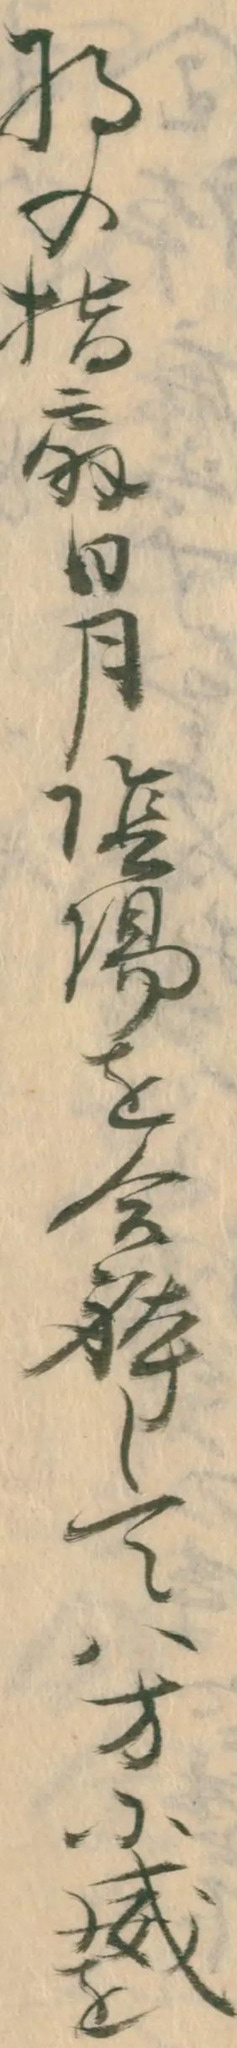将の指扇日月陰陽を合体して八方に威を
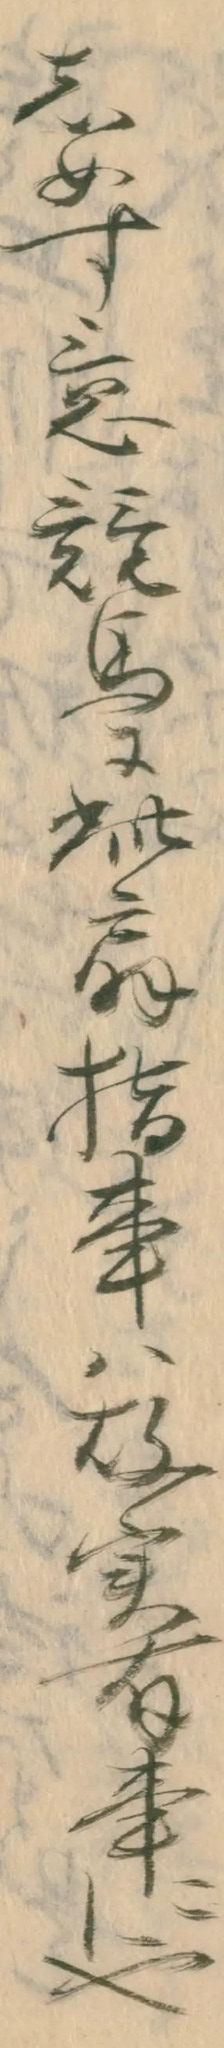しめす意競馬に此扇指事は故実有事にや
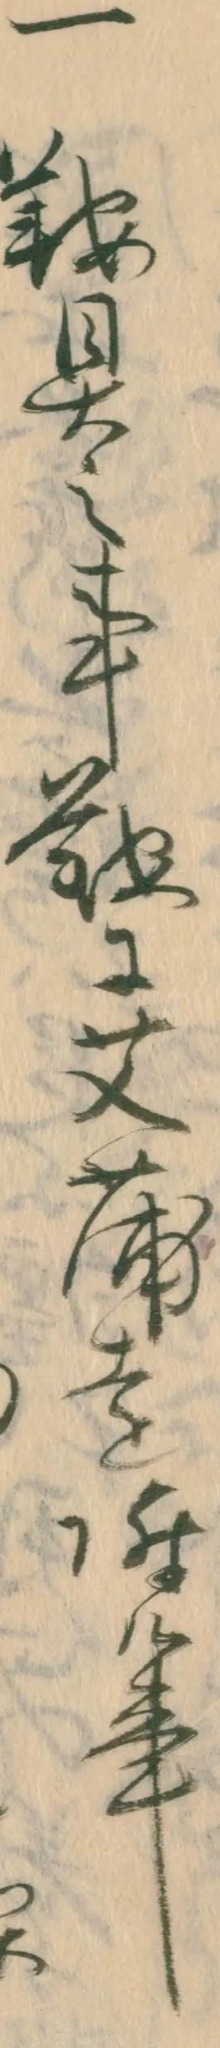一鞍具之事鞍に艾蒲を附る事
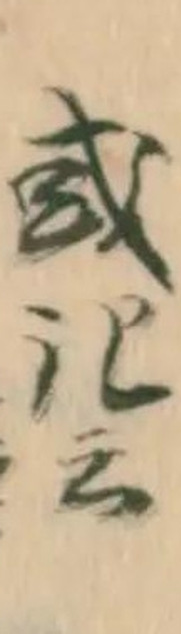或記云
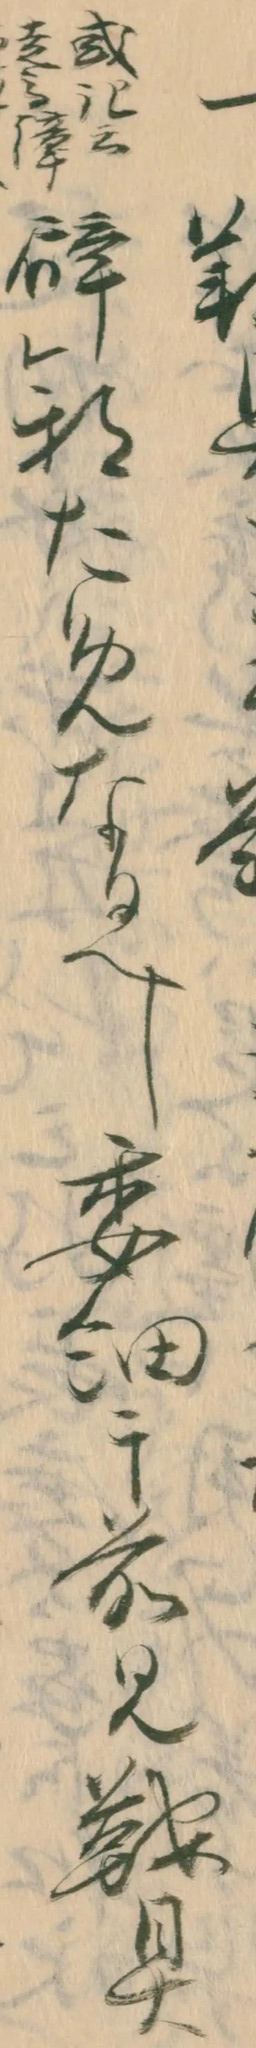辟邪ためなるへし委細于前見鞍具
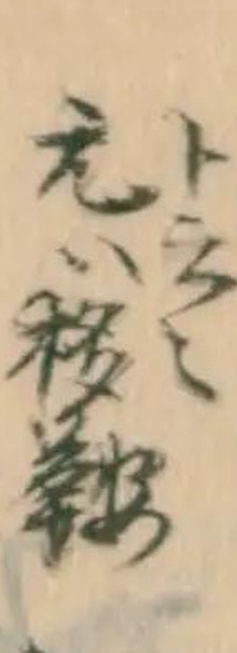元は移鞍
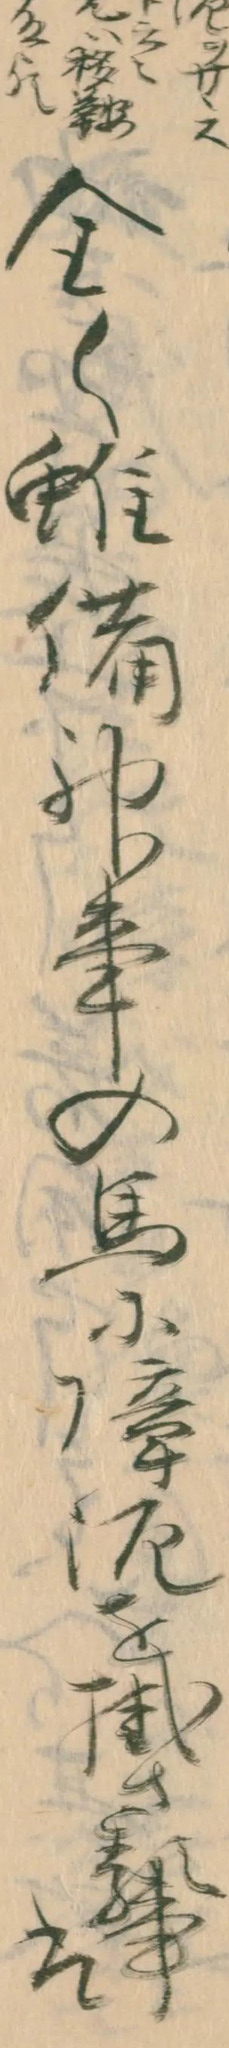全く雖備神事の馬に障泥を掛さる事は
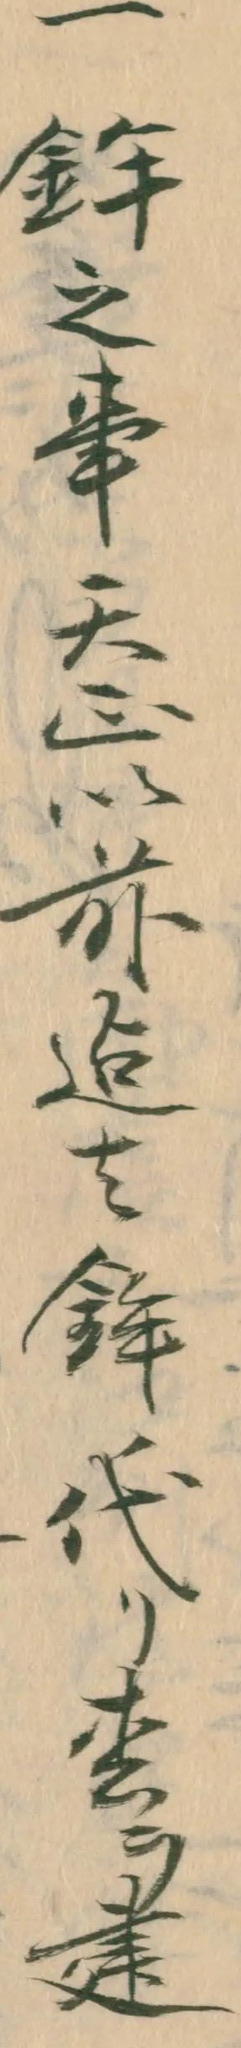一鉾之事天正以前迄は鉾の代り松を建
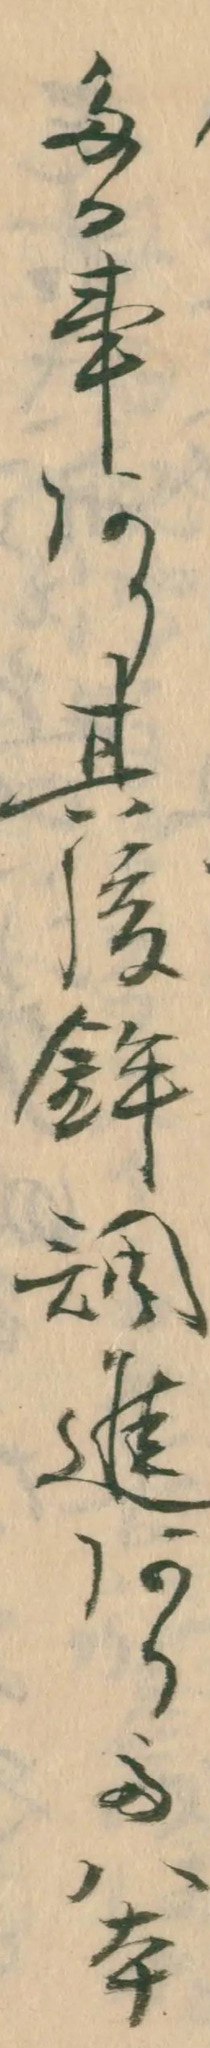たる事あり其後鉾調進ありては本
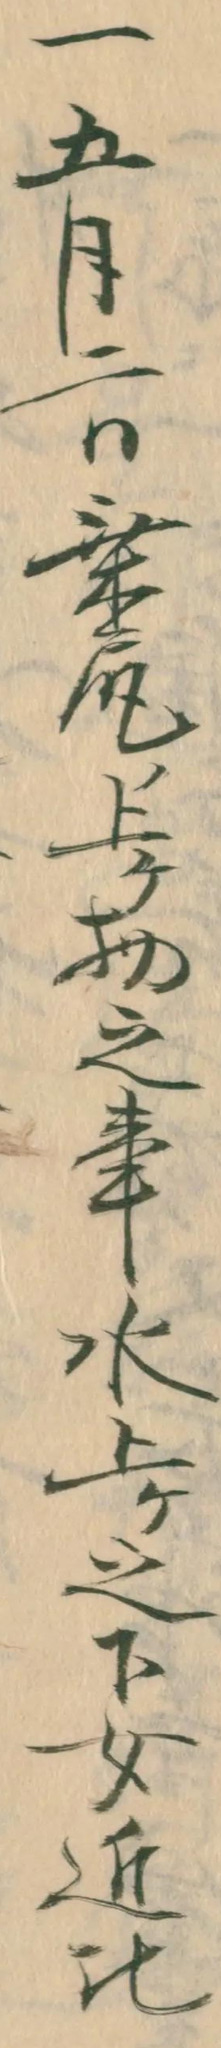一五月二日乗尻の上け物之事水上け之下女近比
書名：賀茂社記録. 第12冊
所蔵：国立国会図書館 National Diet Library, JAPAN
